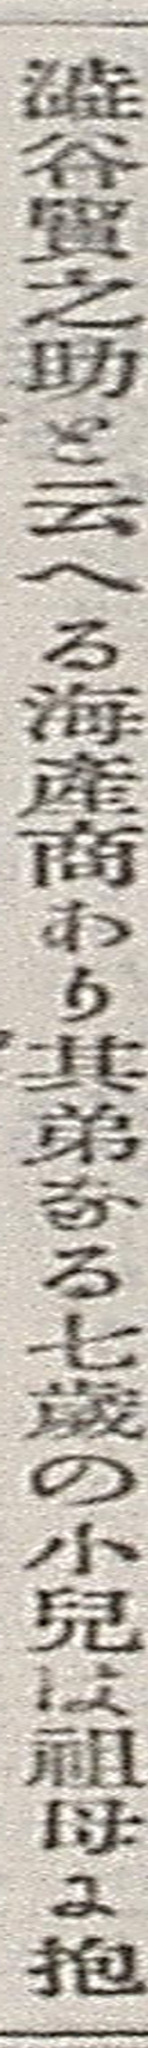渋谷賢之助と云へる海産商あり其弟なる七歳の小兒は祖母に抱
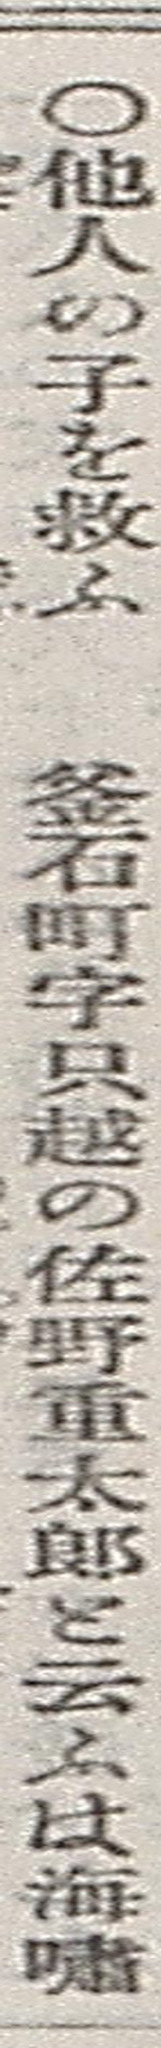○他人の子を救ふ釜石町字只越の佐野重太郎と云ふは海嘯
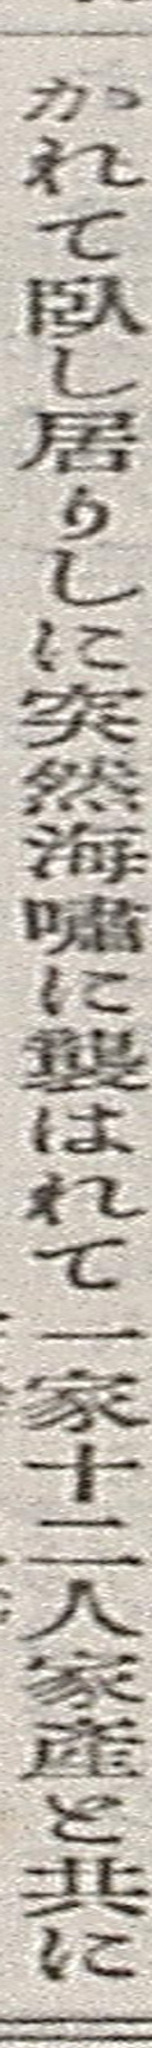かれて臥し居りしに突然海嘯に襲はれて一家十二人家産と共に
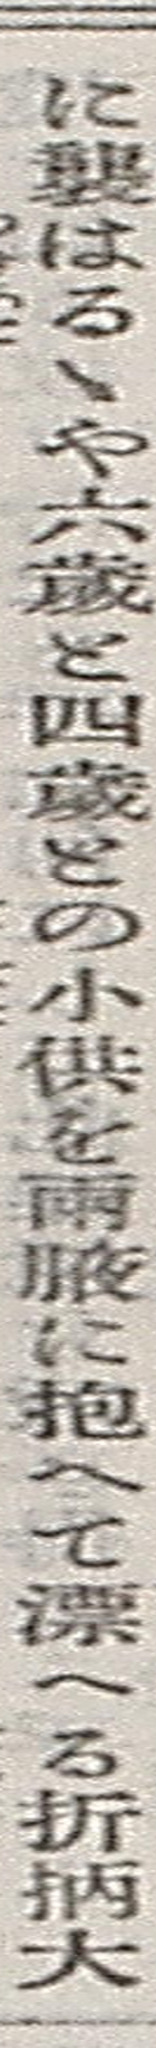に襲はるゝや六歳と四歳との小供を両腋に抱へて漂へる折柄大
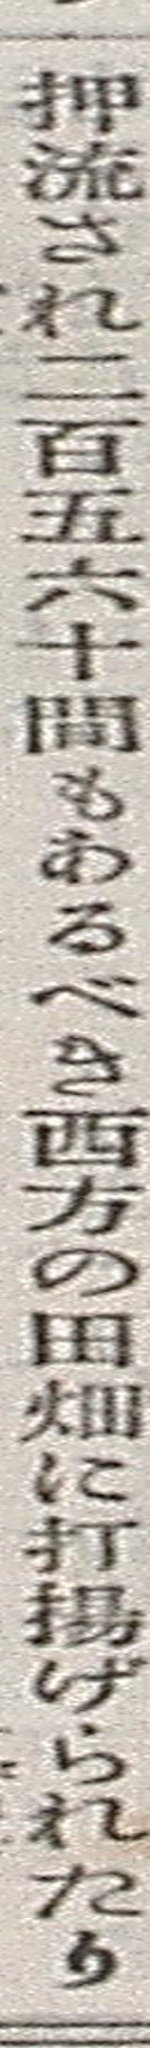押流されニ百五六十間もあるべき西方の田畑に打揚げられたり
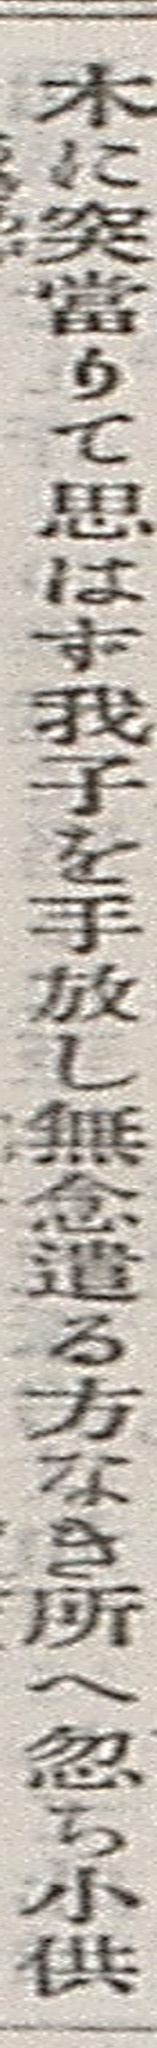木に突当りて思はず我子を手放し無念遣る方なき所へ忽ち小供
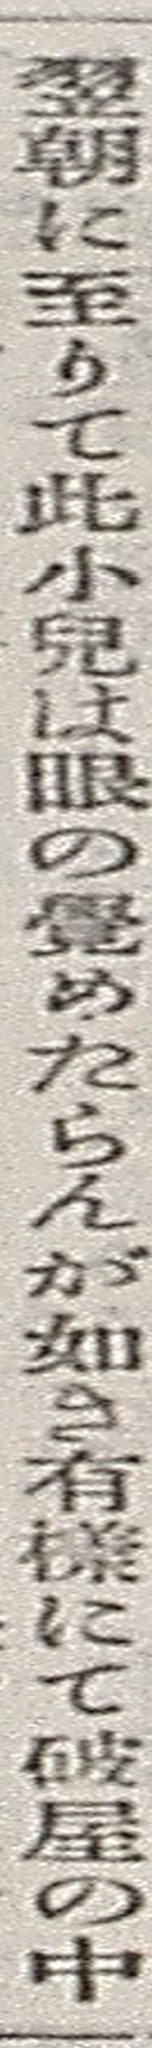翌朝に至りて此小兒は眼の覚めたらんが如き有様にて破屋の中
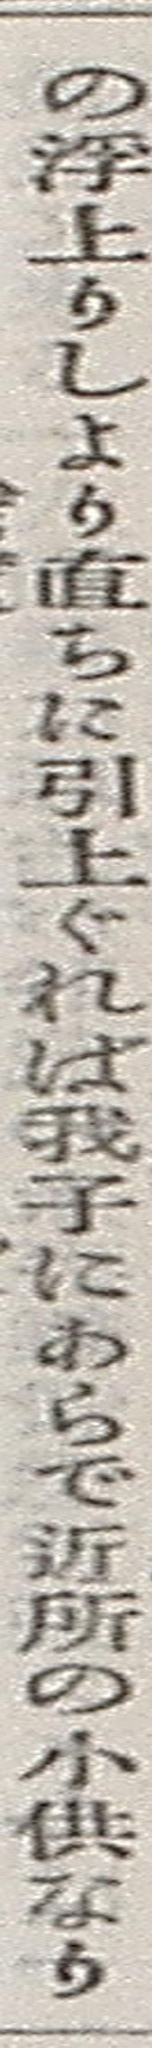の浮上りしより直ちに引上ぐれば我子にあらで近所の小供なり
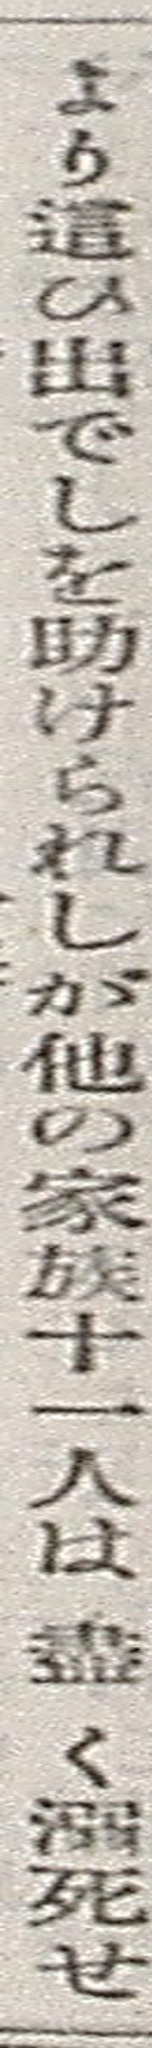より這ひ出でしを助けられしが他の家族十一人は尽く溺死せ
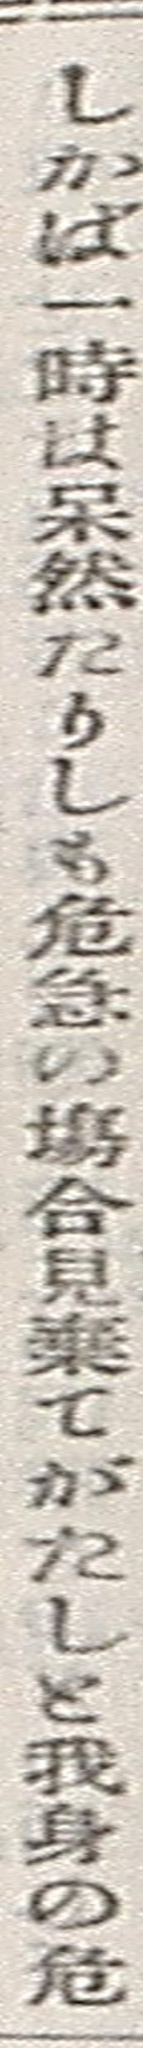しかば一時は呆然たりしも危急の場合見棄てがたしと我身の危
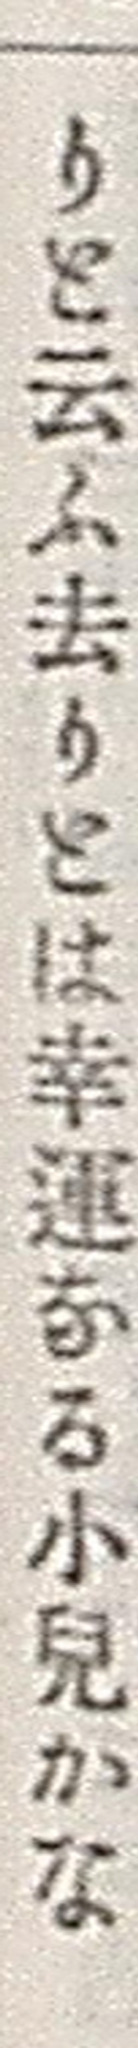りと云ふ去りとは幸運なる小兒かな
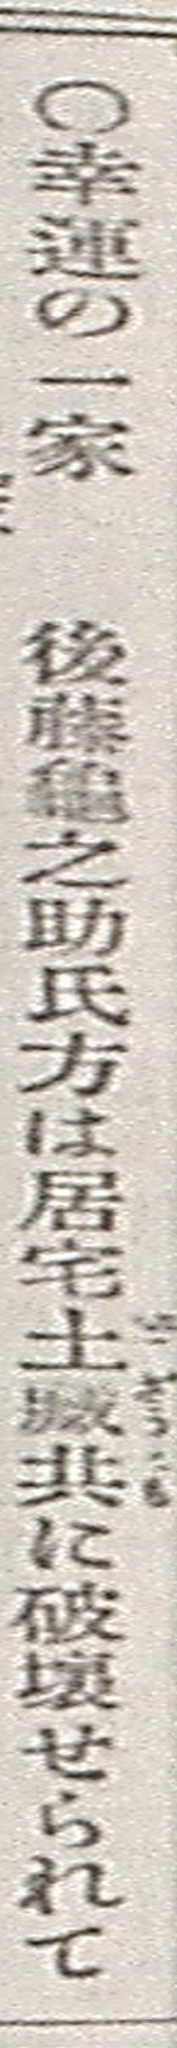○幸運の一家後藤亀之助氏方は居宅土蔵共に破壊せられて
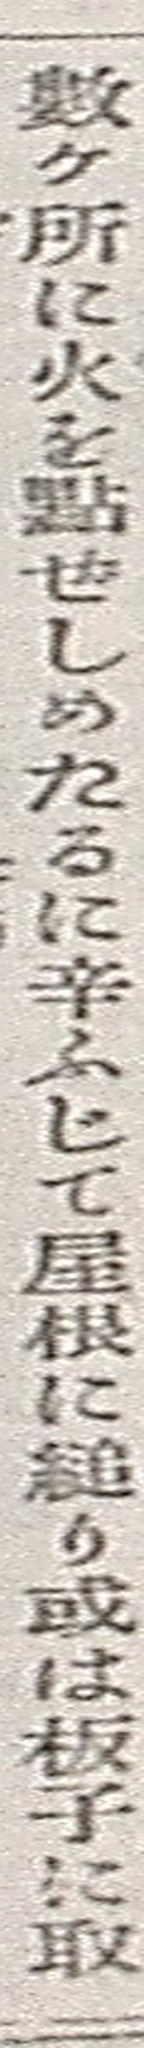数ヶ所に火を点ぜしめたるに辛ふじて屋根に縋り或は板子に取
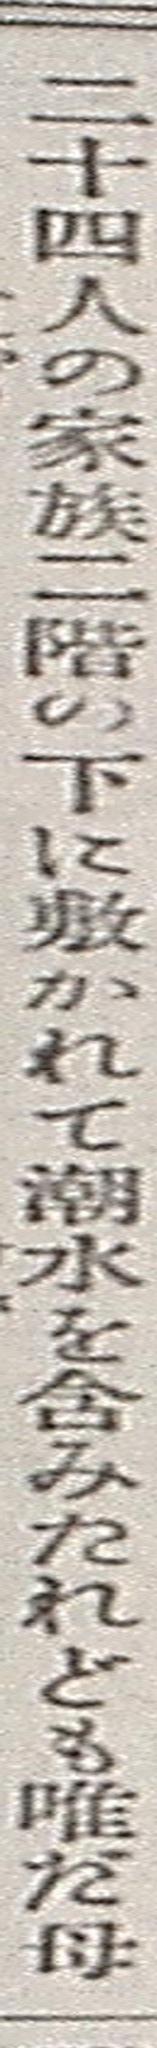二十四人の家族二階の下に敷かれて潮水を含みたれども唯だ母
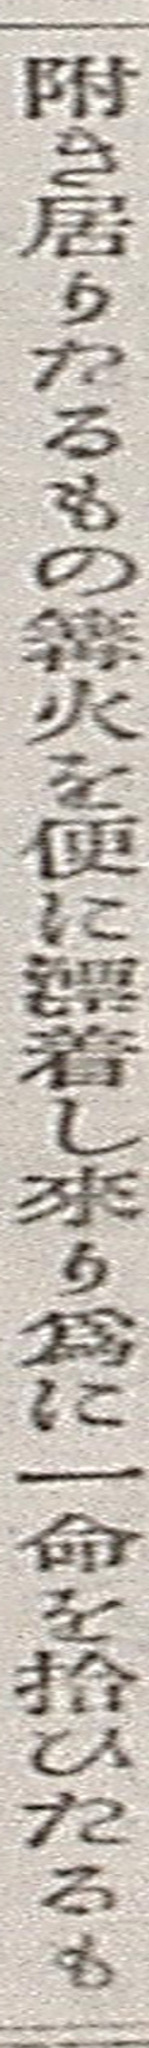付き居りたるもの篝火を便に漂着し来り為に一命を拾ひたるも
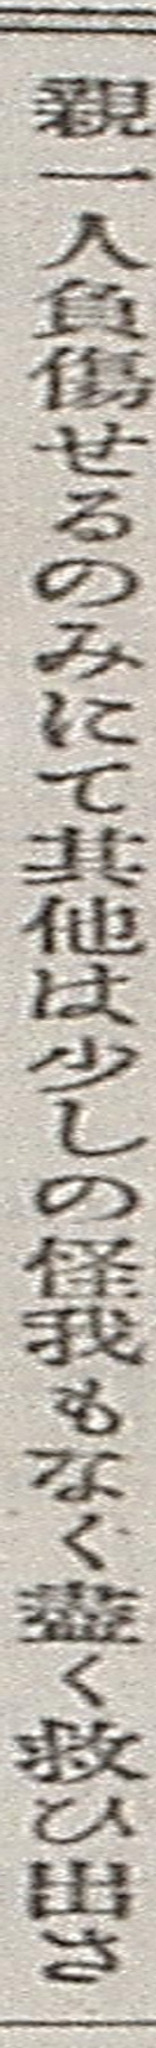親一人負傷せるのみにて其他は少しの怪我もなく尽く救ひ出さ
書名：風俗畫報臨時増刊第百二十號　大海嘯被害録（下）
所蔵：東京大学地震研究所図書室 Earthquake Research Institute Library, The University of Tokyo, JAPAN
